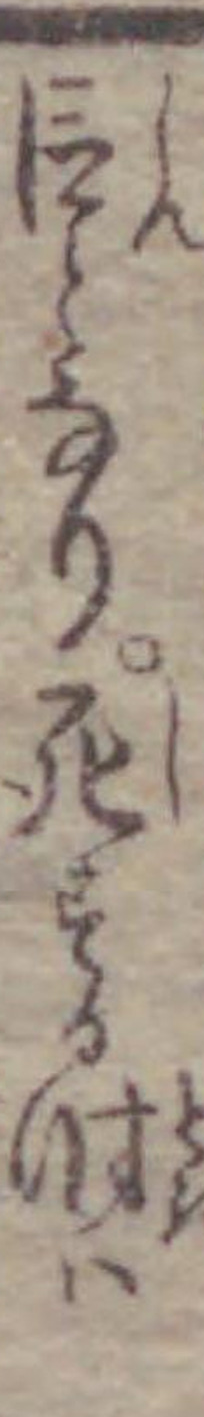臣となり。死する時は
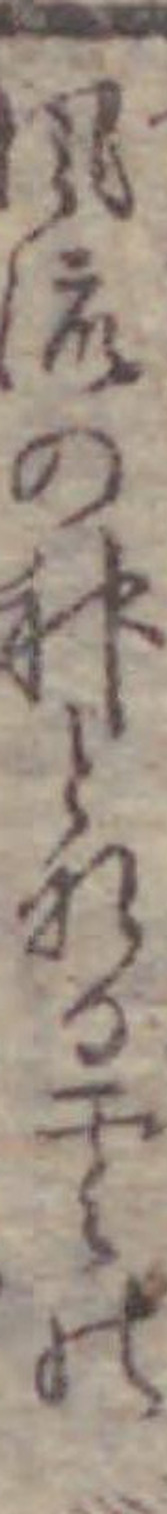風流の神となる。雲の
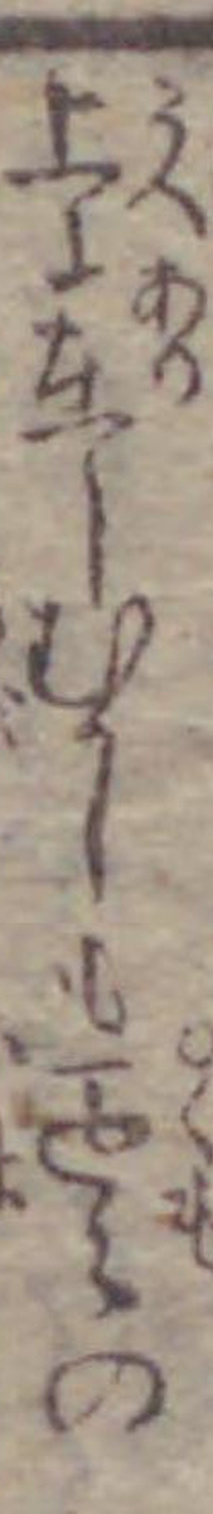上に在しむかしも。雲の
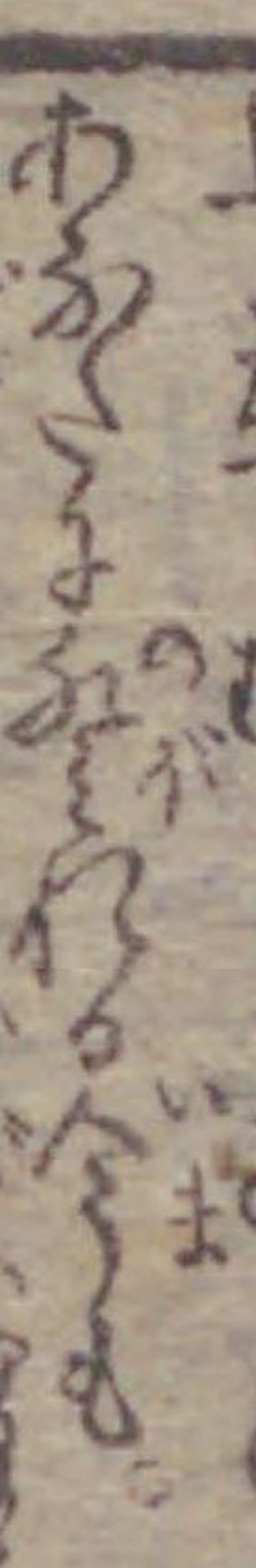あなたに登れる今も
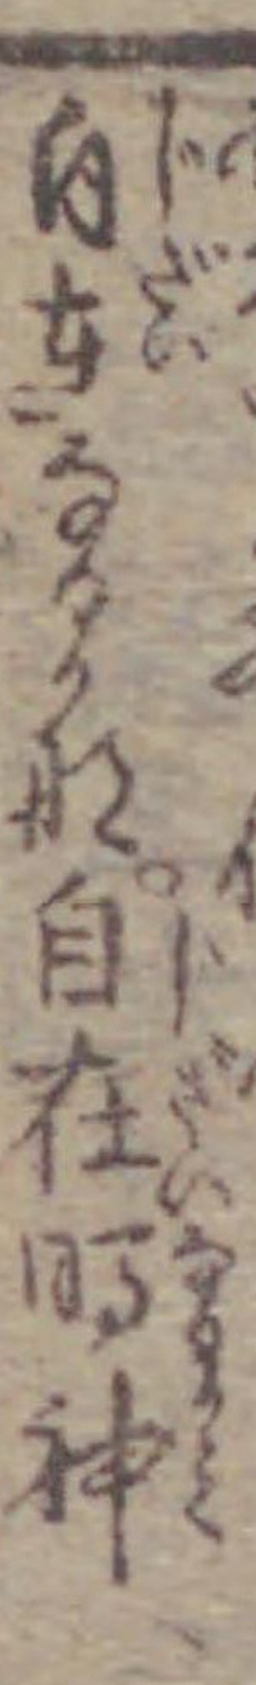自在なるかな。自在鳴神
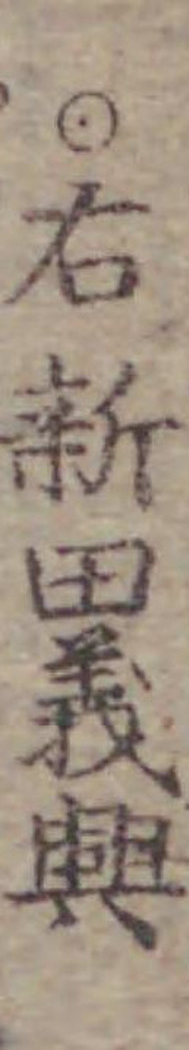○右新田義興
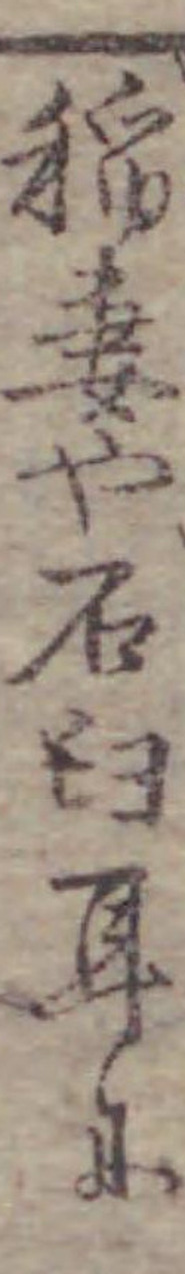稲妻や石臼耳に
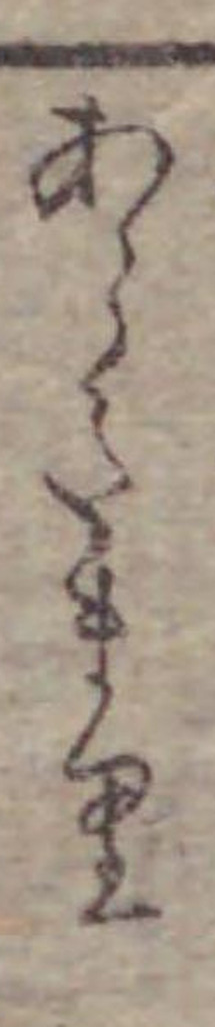あらたまり
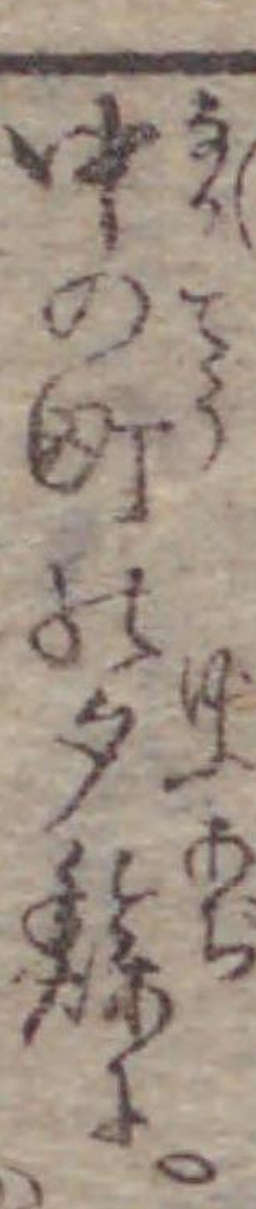中の町の夕鯵に。
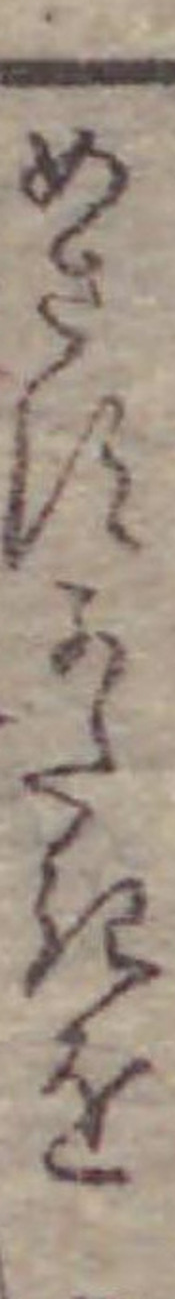めさすかたきを
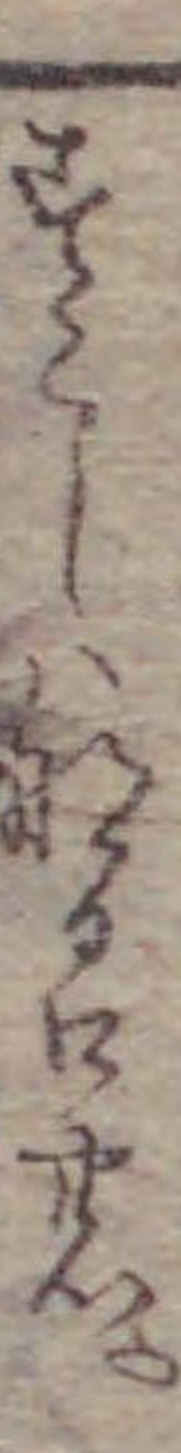すこしはなる口の。
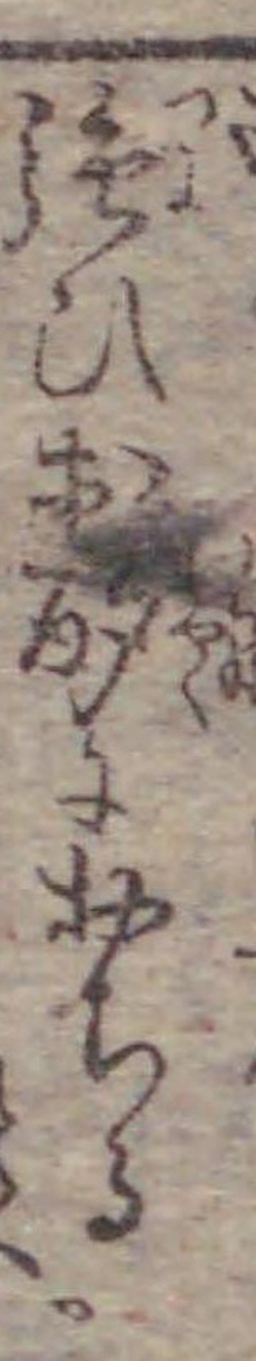強ひお酌ににおちる
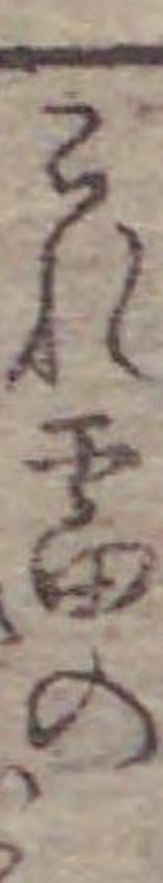これ雷の
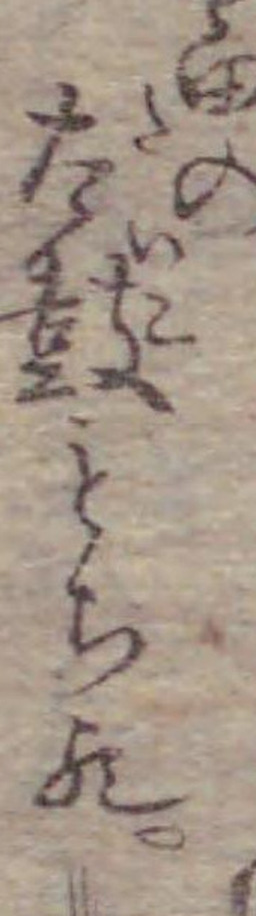太鼓もち歟。

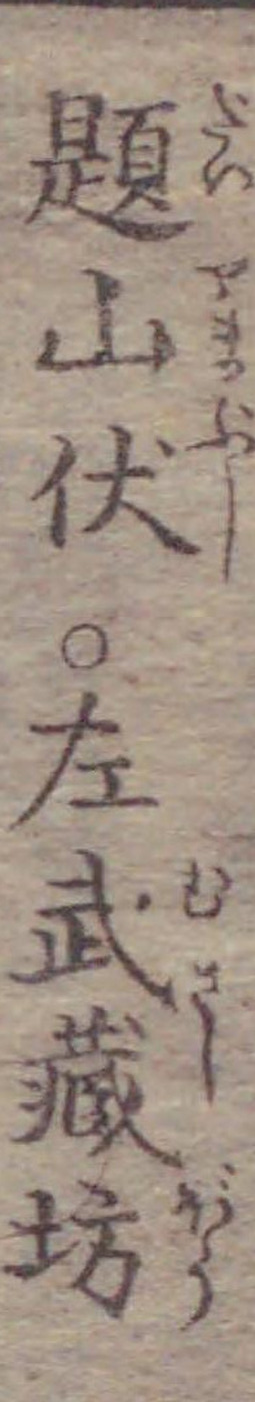題山伏○左武蔵坊
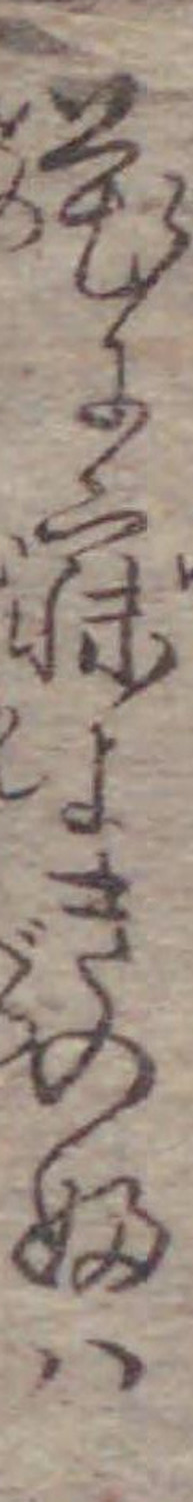花に寝よきのふは
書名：武者合天狗俳諧 : 2巻
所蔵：国立国会図書館 National Diet Library, JAPAN
